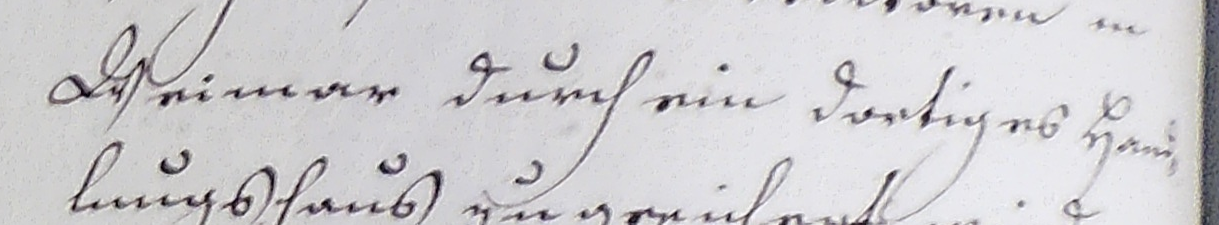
Weimar durch ein dortiges Hand¬
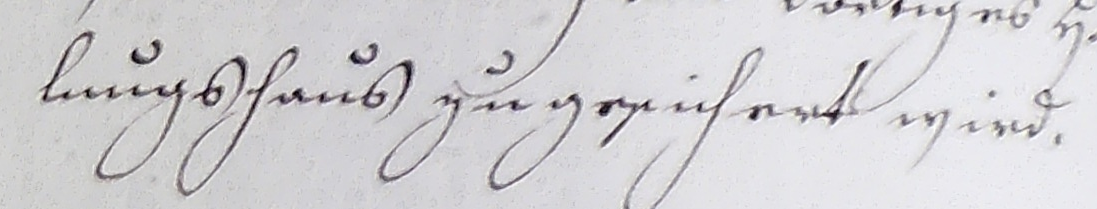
lungshaus zungesichert wird.
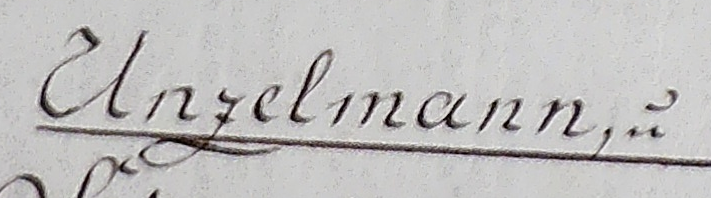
Unzelmann, u
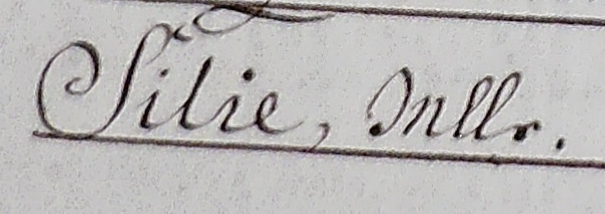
Silie, Mlle.
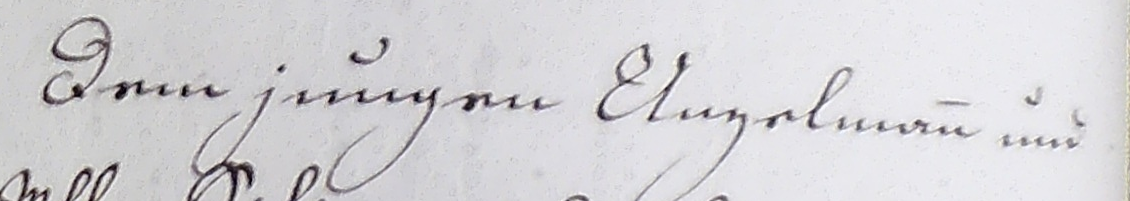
Dem jungen Unzelman̅ und
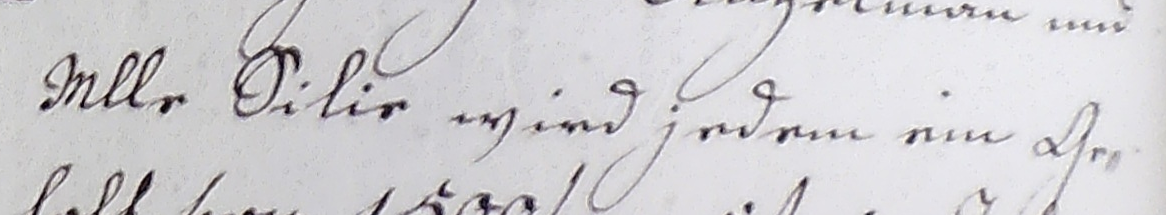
Mlle Silie wird jedem ein Ge¬
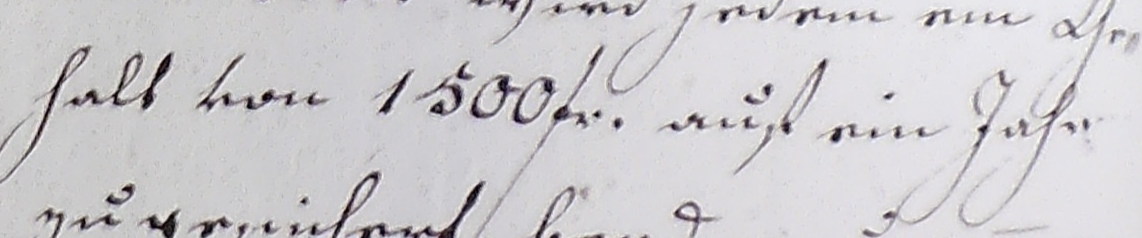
halt von 1500fr. auf ein Jahr
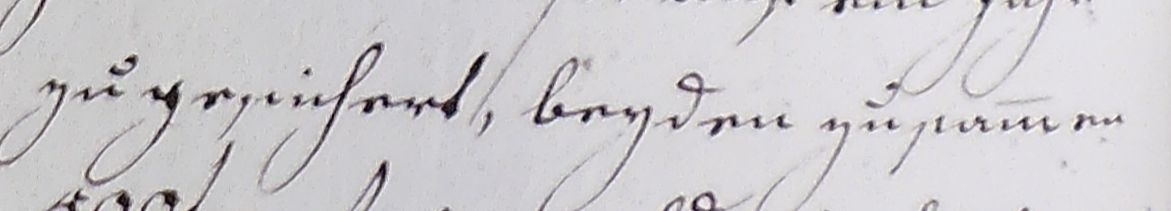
zugesichert, beyden zusam̅en
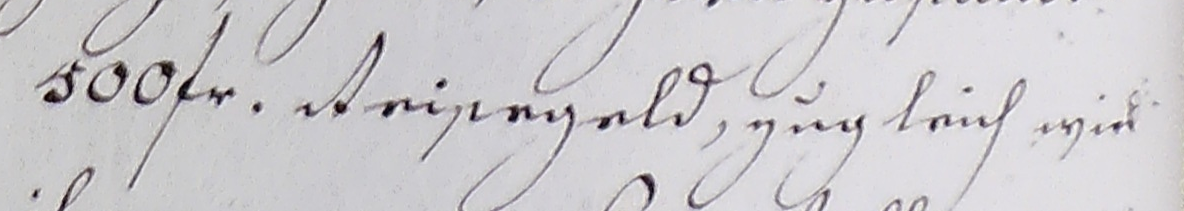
500fr. Reisegeld, zugleich wird
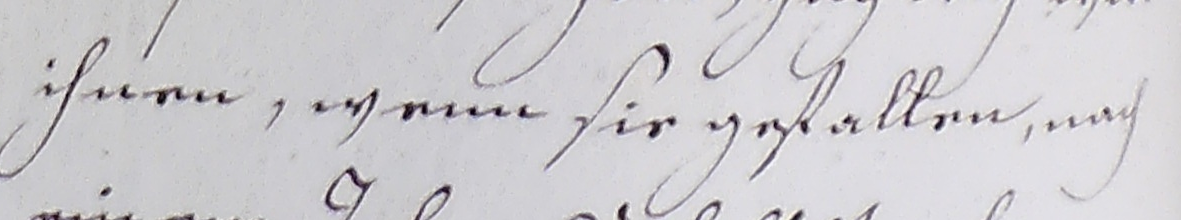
ihnen, wenn sie gefallen, nach
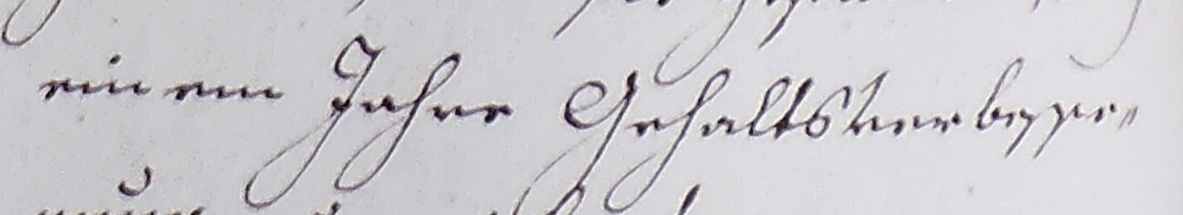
einem Jahre Gehaltsverbesse¬
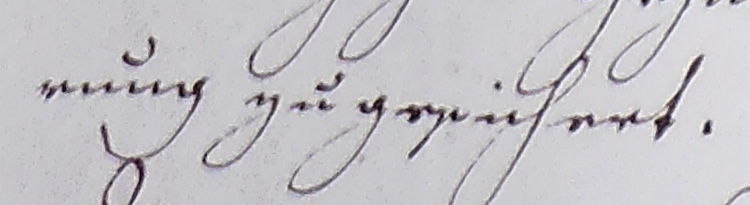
rung zu gesichert.
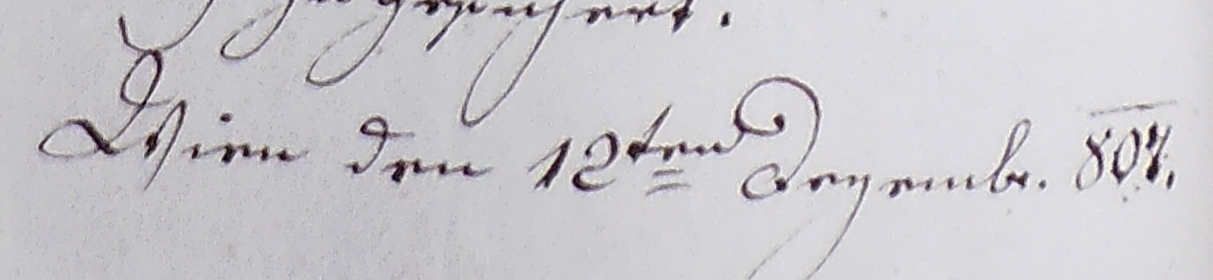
Wien den 12te͇n Dezembe. 8͞0͞7.
